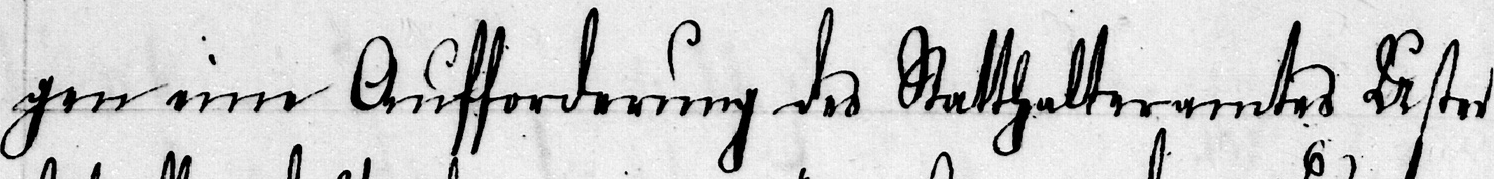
gen eine Aufforderung des Statthalteramtes Uster
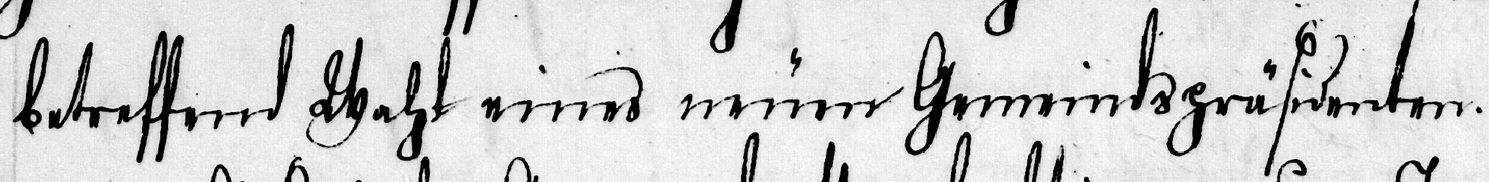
betreffend Wahl eines neuen Gemeindspräsidenten.
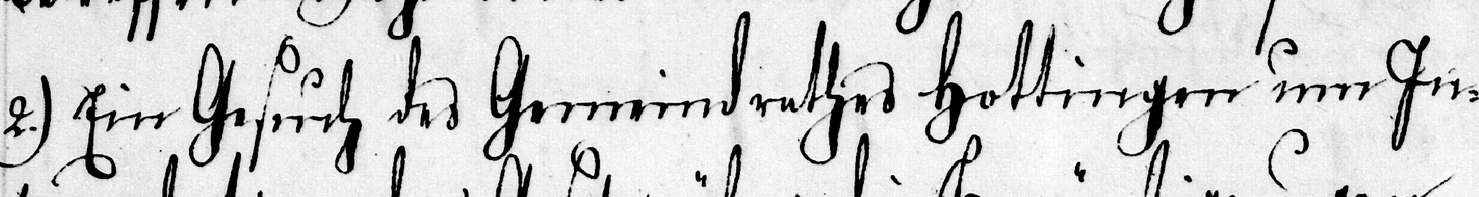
2.) Ein Gesuch des Gemeindrathes Hottingen um In¬
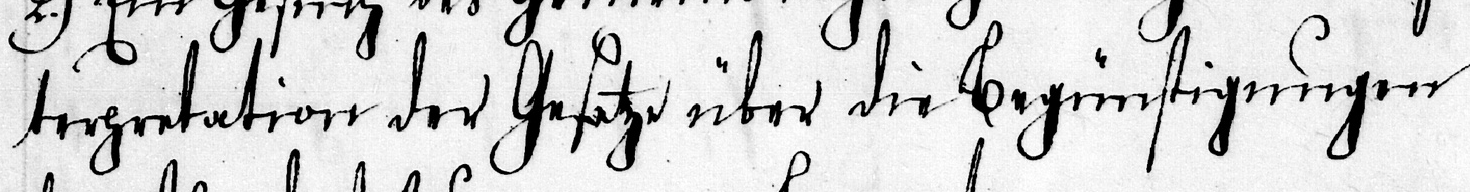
terpretation der Gesetze über die Begünstigungen
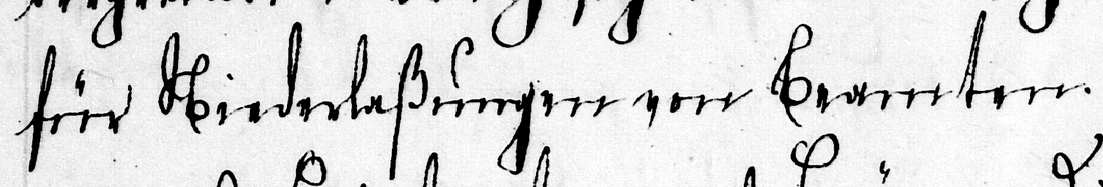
für Niederlaßungen von Beamten.
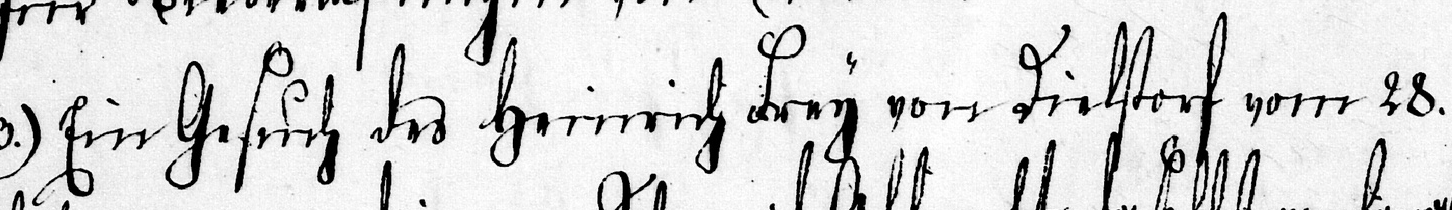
Ein Gesuch des Heinrich Frey von Dielstorf vom 28.
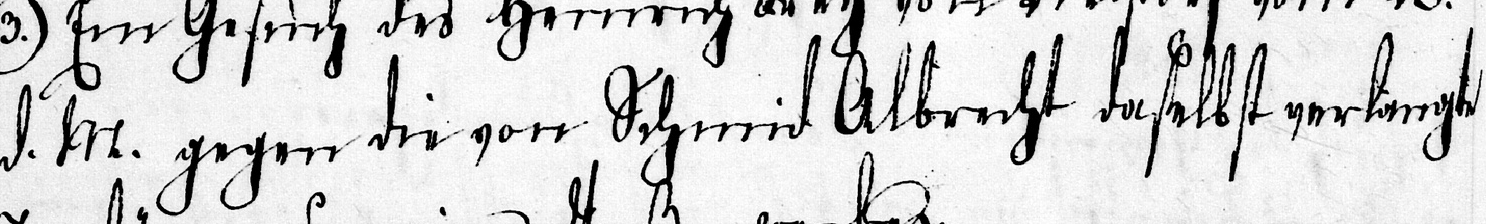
d. M. gegen die von Schmid Albrecht daselbst verlang¬
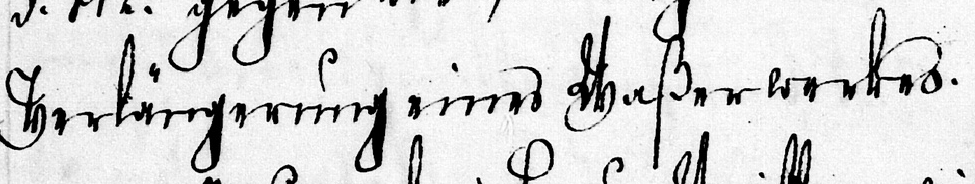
Verlängerung eines Waßerwerkes.
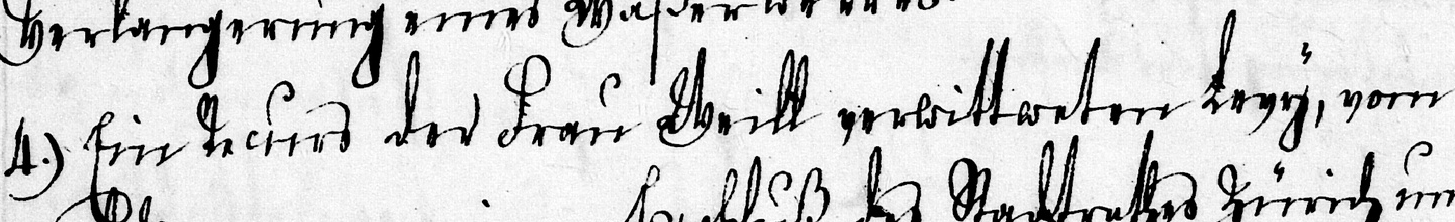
4.) Ein Recurs der Frau Weill verwittweten Levy, vom
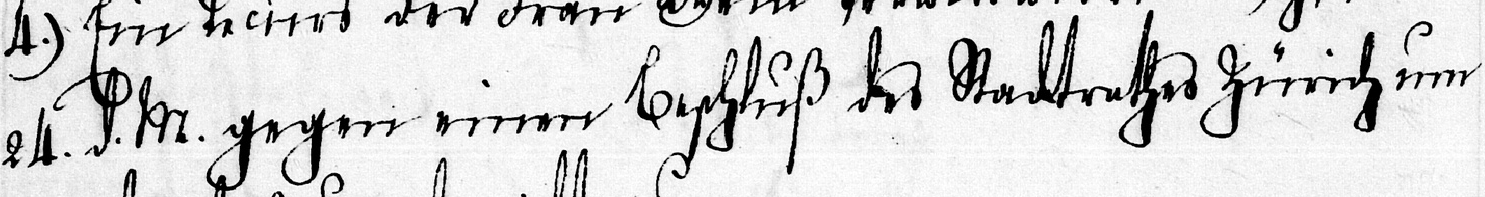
24. d. M. gegen einen Beschluß des Stadtrathes Zürich um
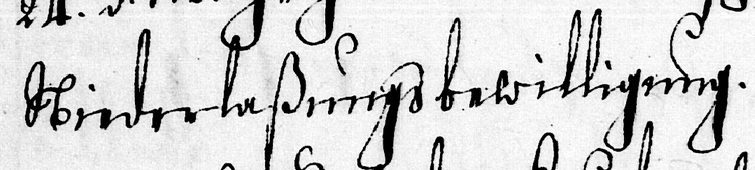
Niederlaßungsbewilligung.
